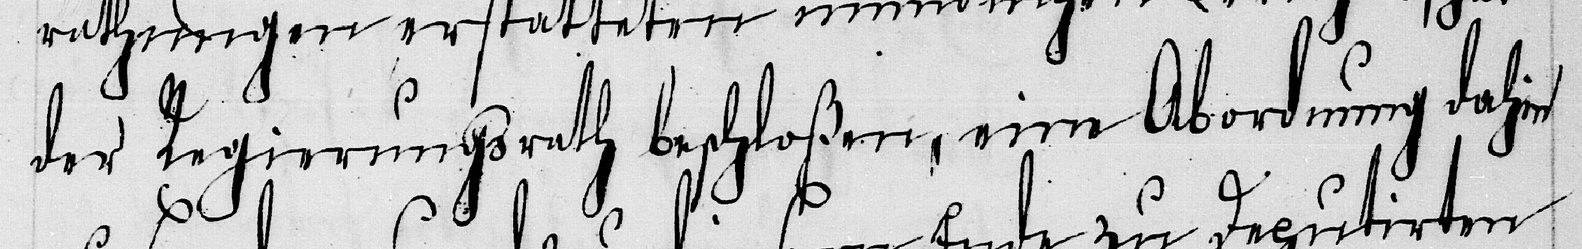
der Regierungsrath beschloßen, eine Abordnung dahin
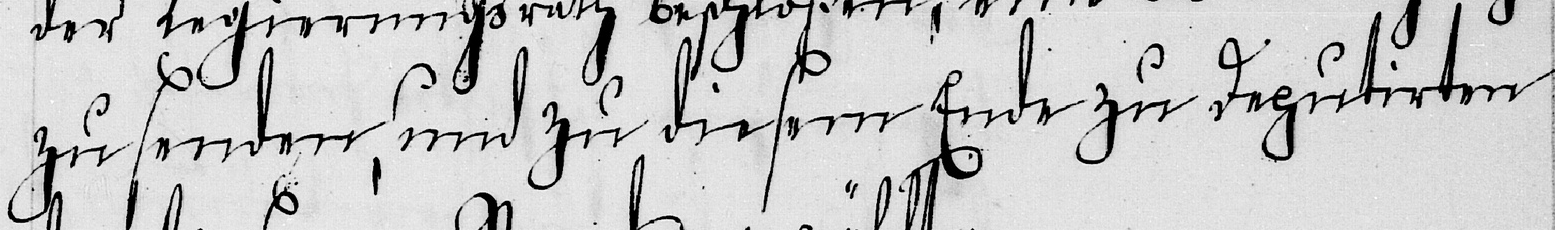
zu senden, und zu diesem Ende zu Deputirten
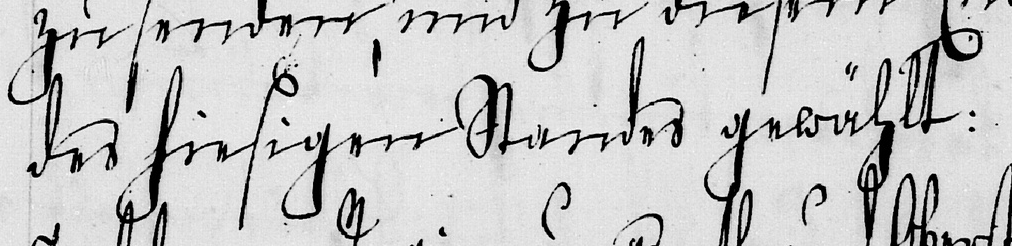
des hiesigen Standes gewählt:
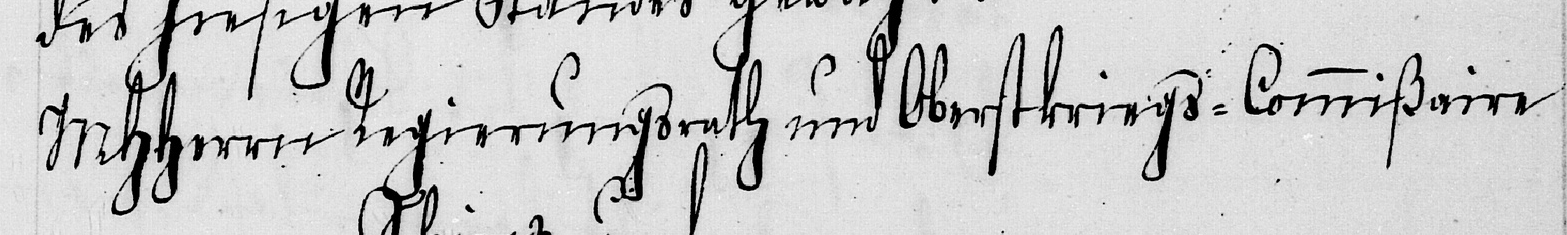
MHHerrn Regierungsrath und Oberstkriegs-Commißaire
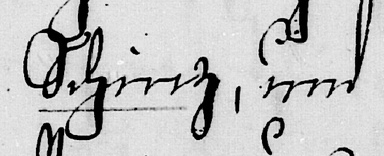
Schinz, und
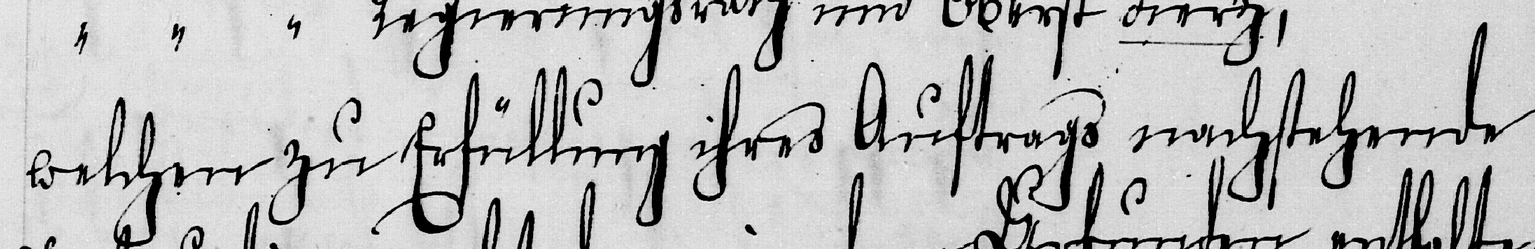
welchen zu Erfüllung ihres Auftrages nachstehende
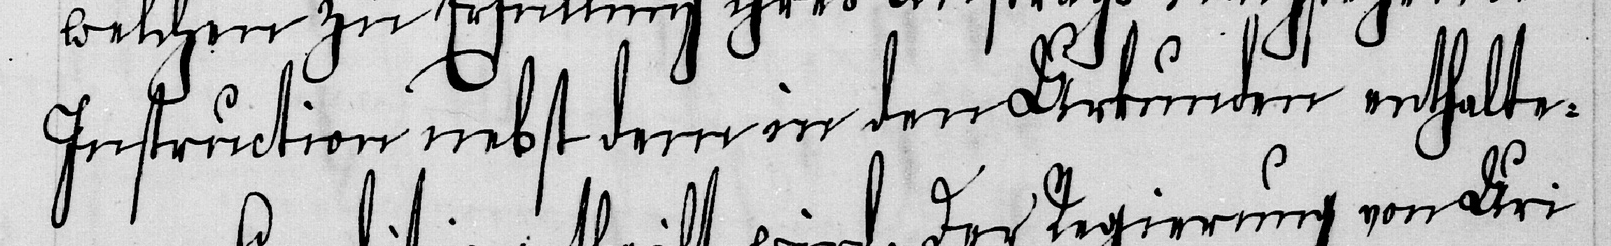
Instruction nebst dem in den Urkunden enthalte¬
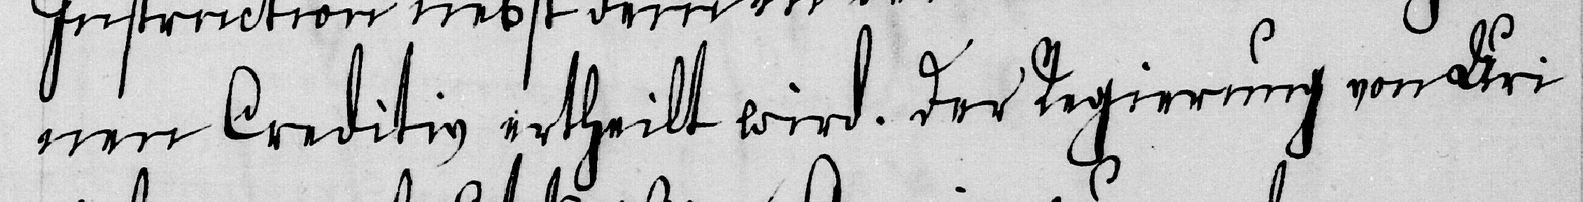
nen Creditiv ertheilt wird. Der Regierung von Uri
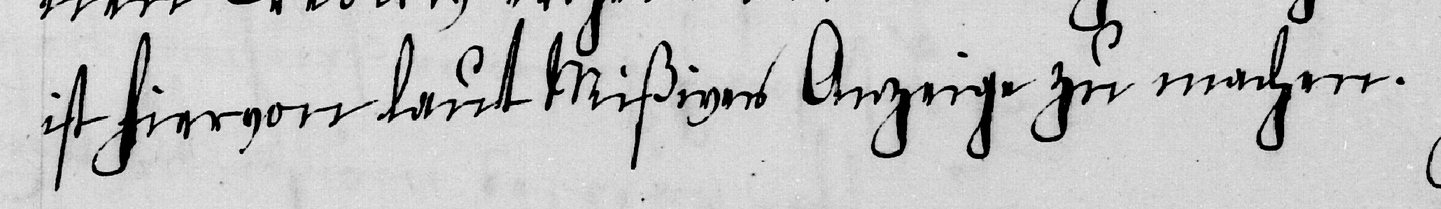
ist hiervon laut Mißiven Anzeige zu machen.
